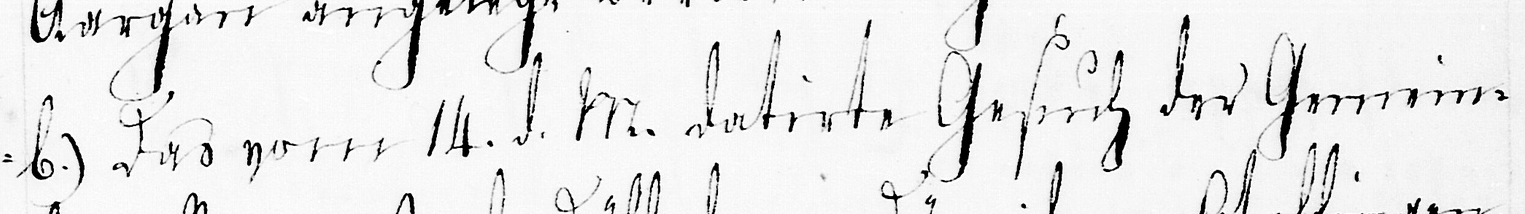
b.) Das vom 14. d. M. datirte Gesuch der Gemein¬
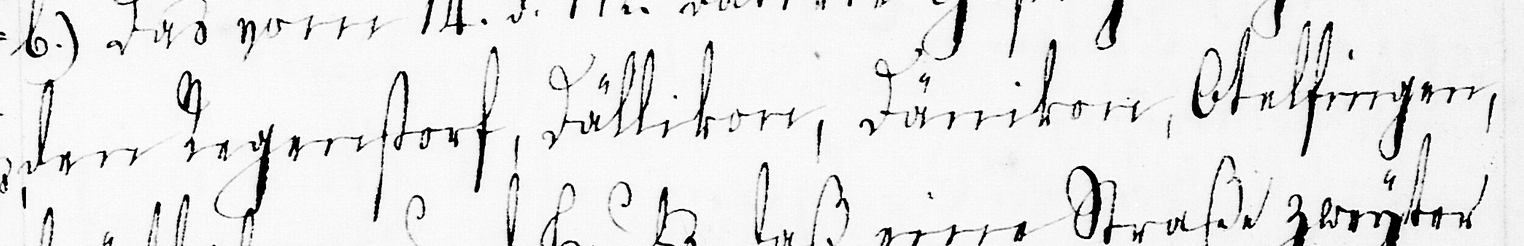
den Regenstorf, Dällikon, Dänikon, Otelfingen,
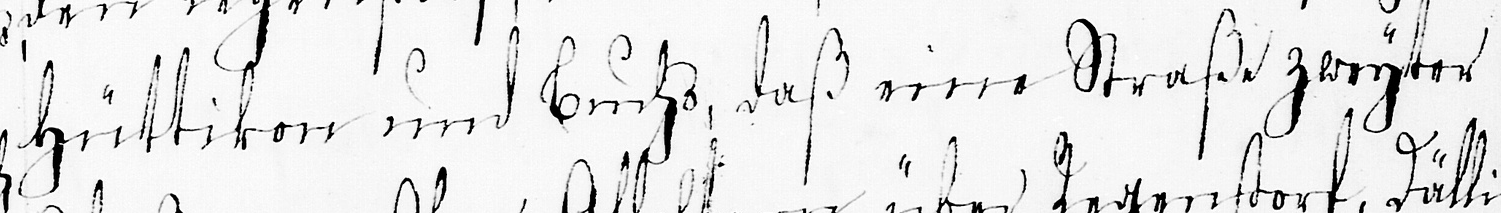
Hüttikon und Buchs, daß eine Straße zweyter
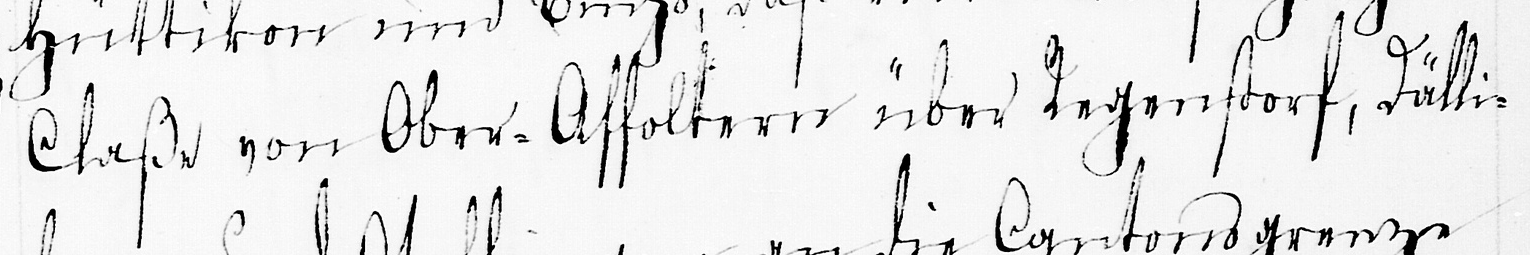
Claße von Ober-Affoltern über Regenstorf, Dälli¬
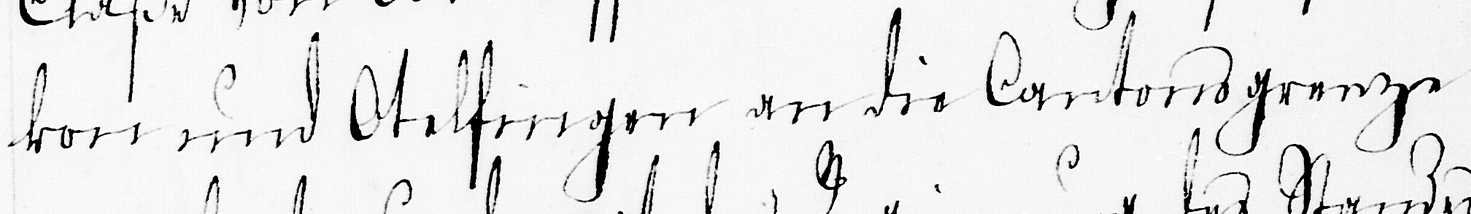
kon und Otelfingen an die Cantonsgrenze
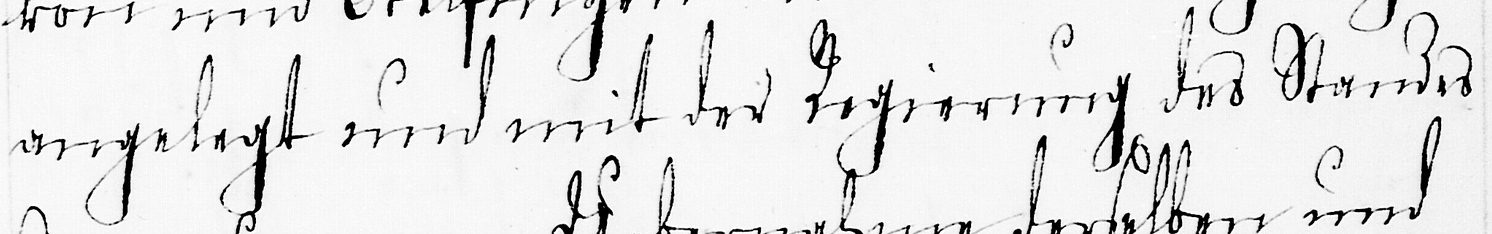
angelegt und mit der Regierung des Standes
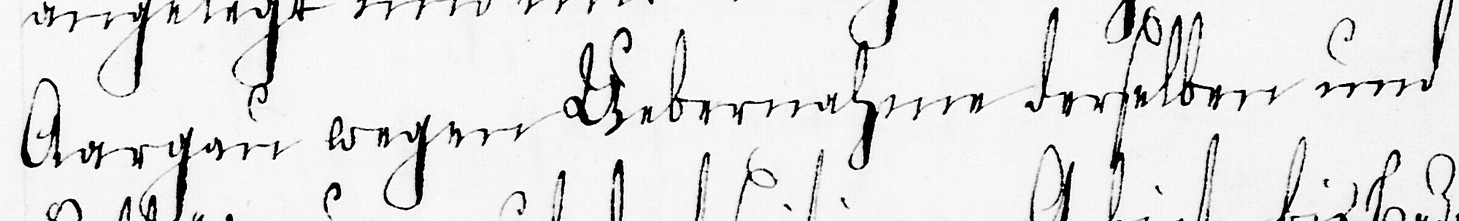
Aargau wegen Uebernahme derselben und
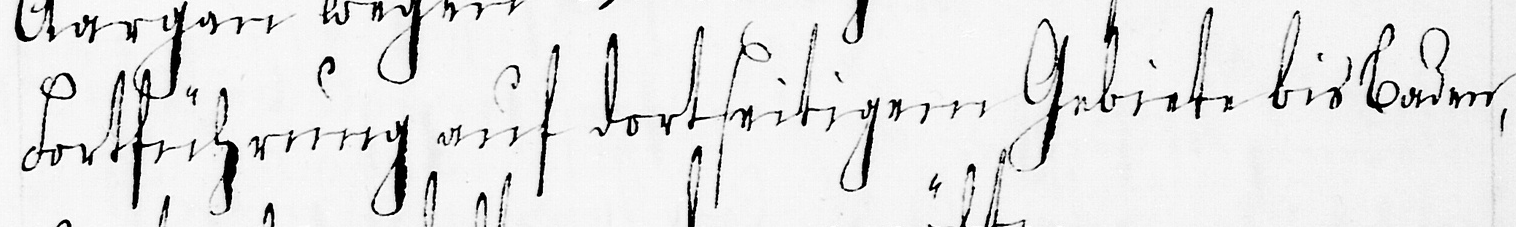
Fortführung auf dortseitigem Gebiete bis Baden,
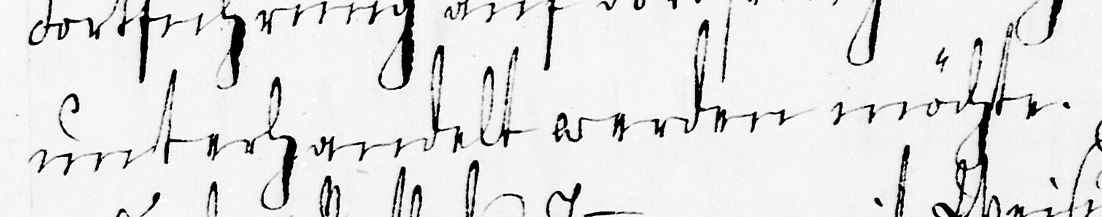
unterhandelt werden möchte.
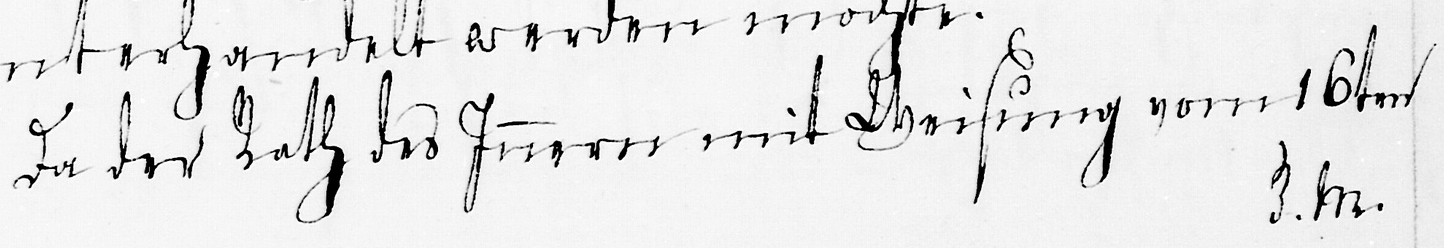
Da der Rath des Innern mit Weisung vom 16ten
